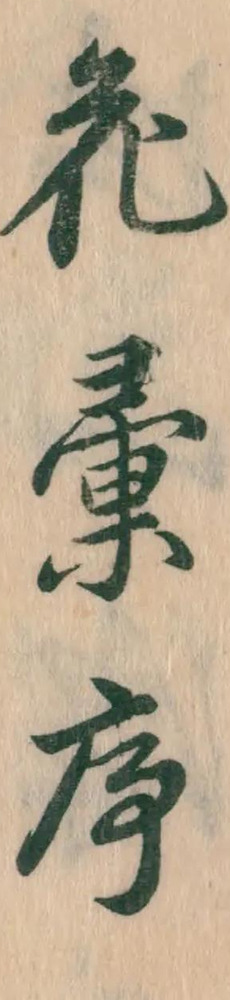花彙序
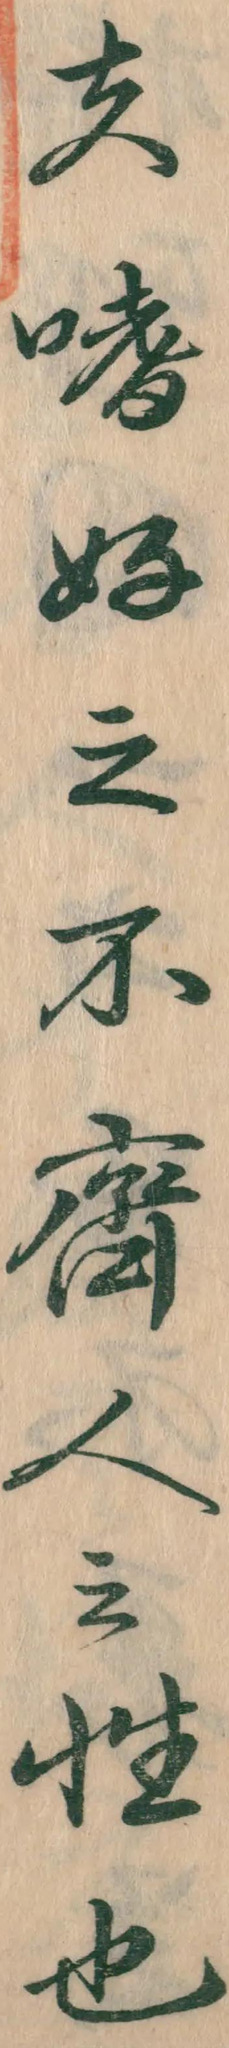夫嗜好之不齊人云性也
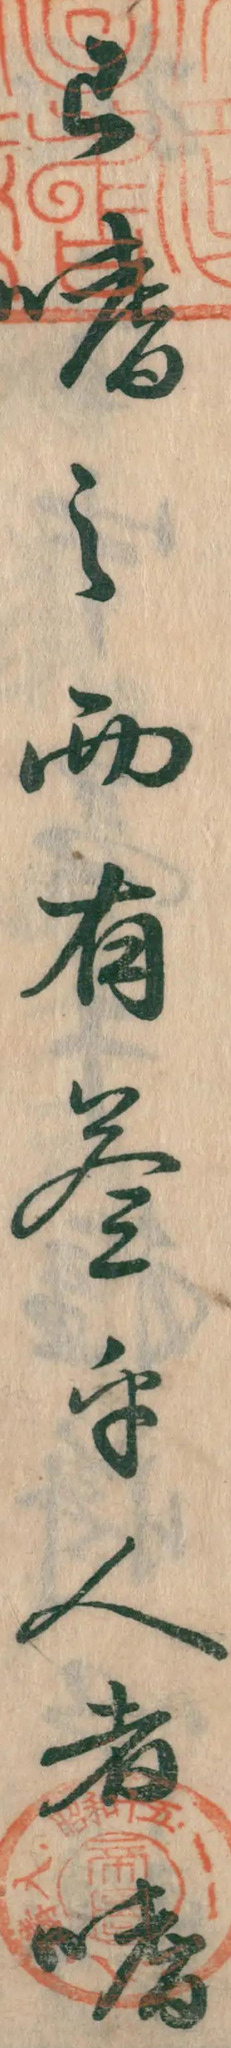己嗜之而有益乎人者嗜
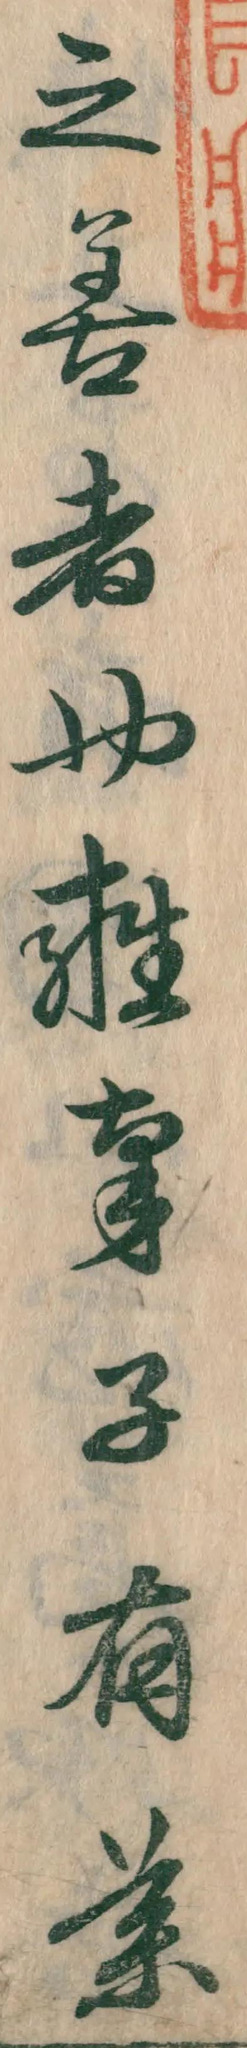之善者功雍南子有薬
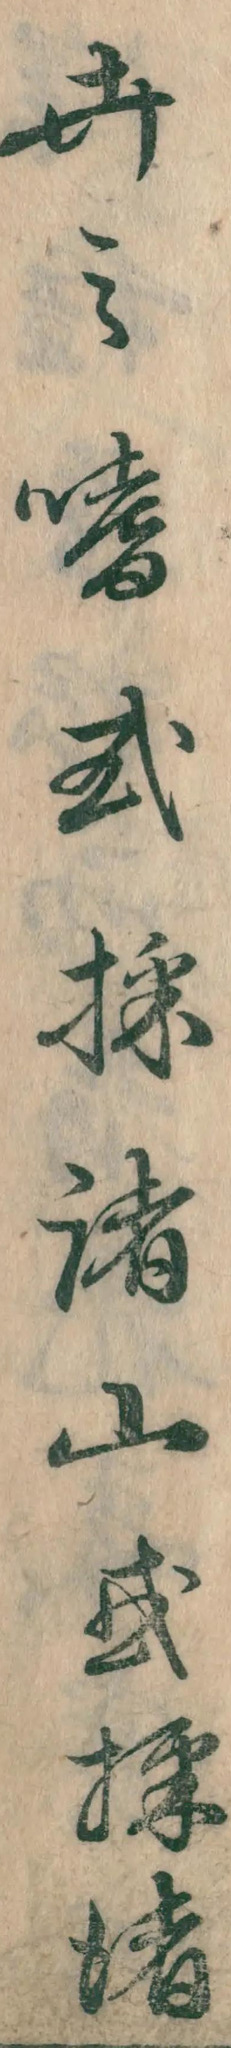卉之嗜或採諸山或採堵

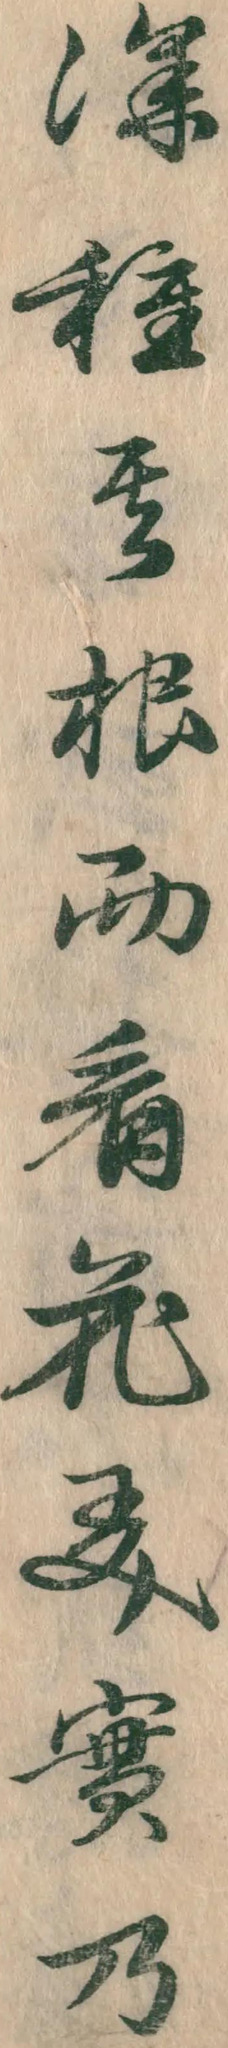深種其根而看花弄実乃
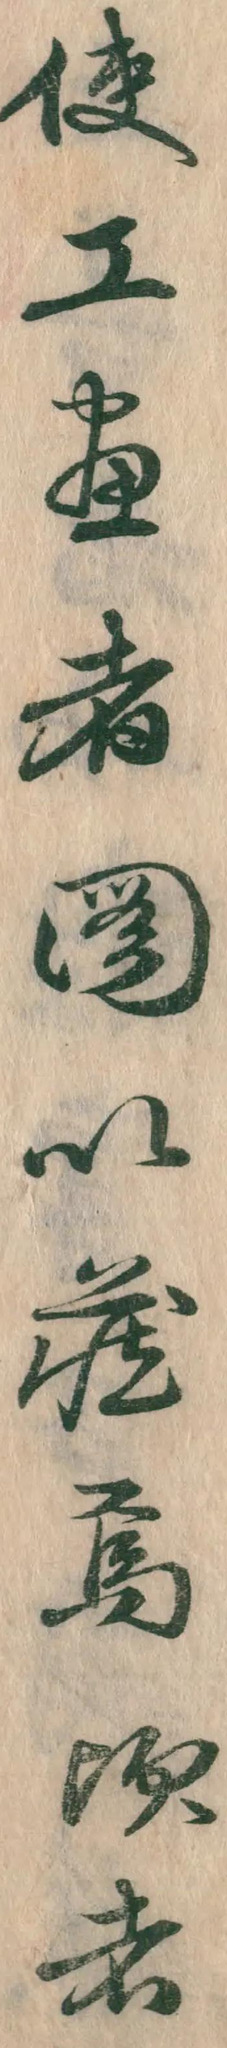使工画者図以蔵焉頃者
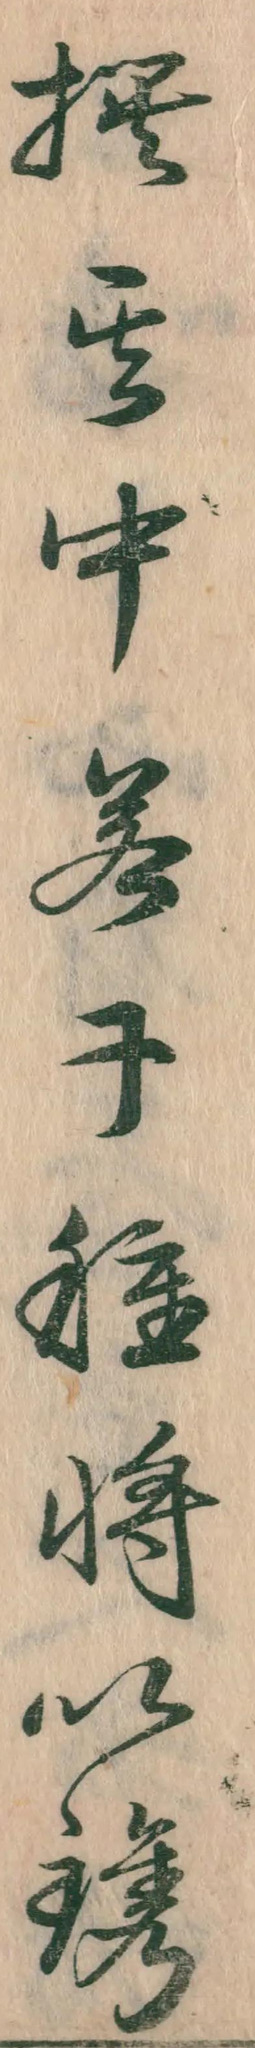撰其中巻于種将以鐫
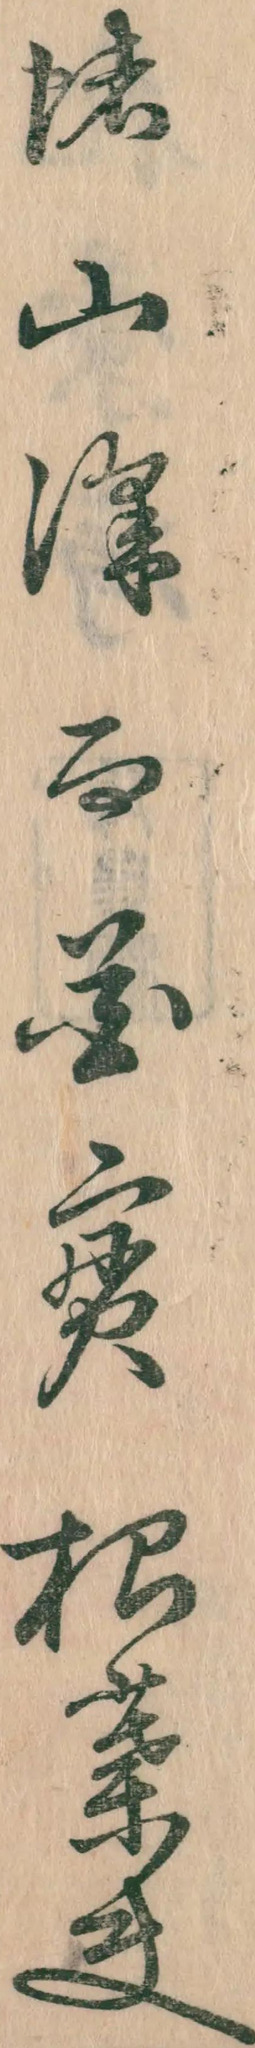堵山深而花実根葉夫
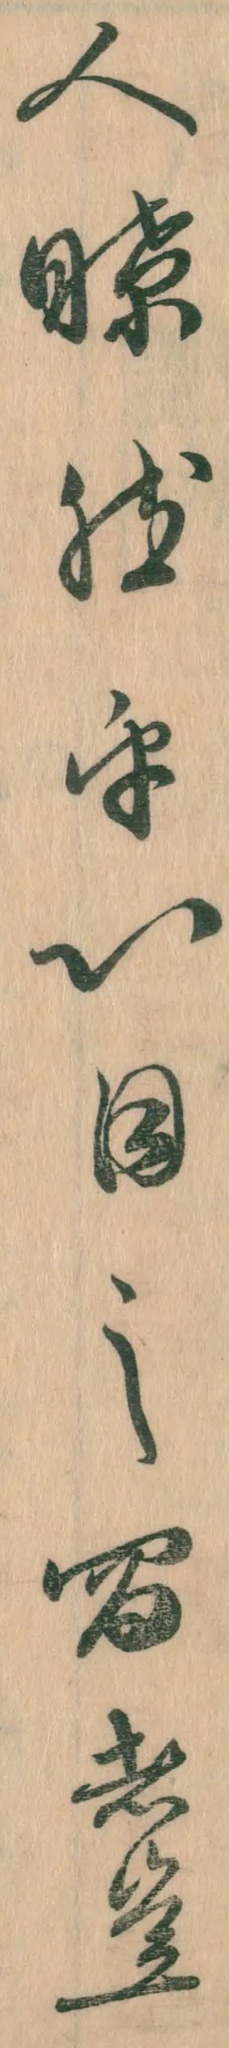人瞭然乎一目之間者豈
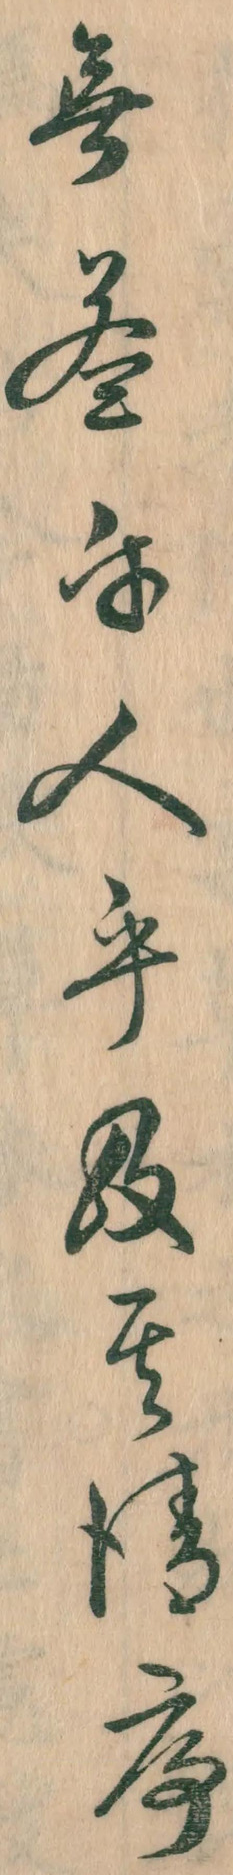無益乎人乎及其情序
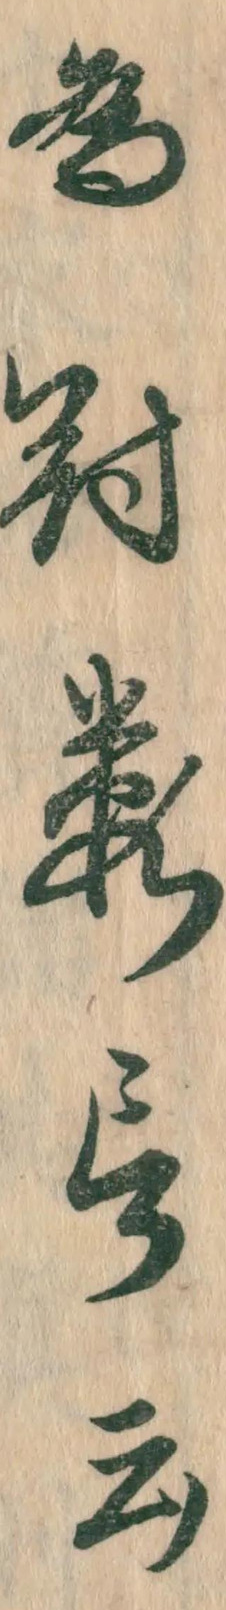為対数尽云
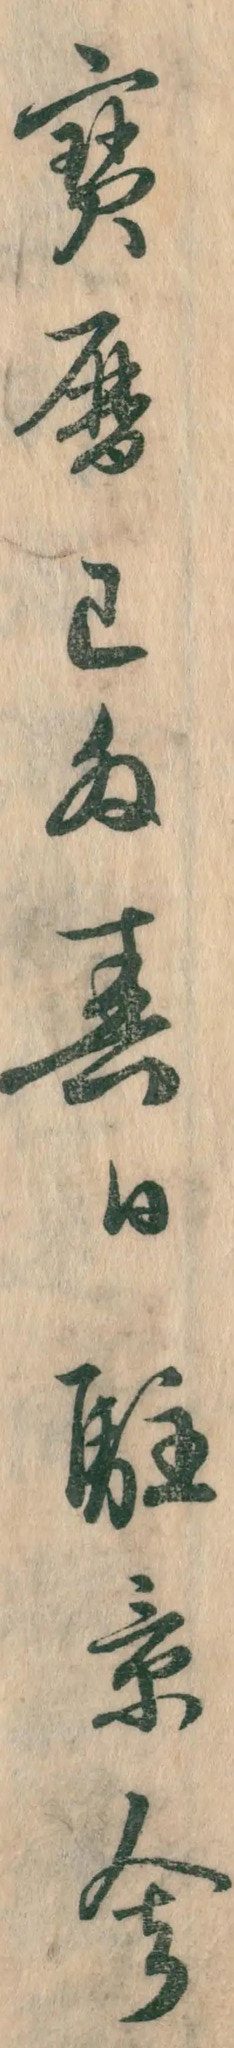宝暦己卯春日駐景舎

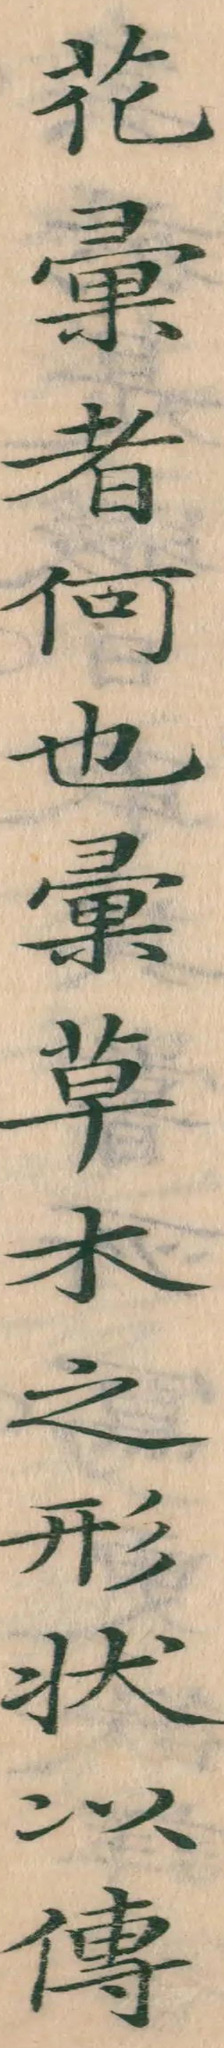花彙者何也。彙草木之形状以伝
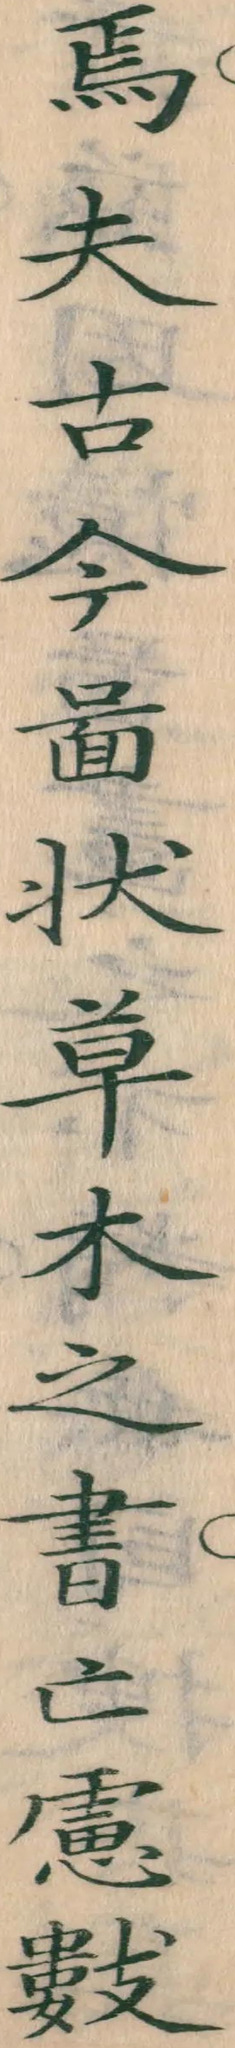焉。夫古今図状草木之書。亡慮数
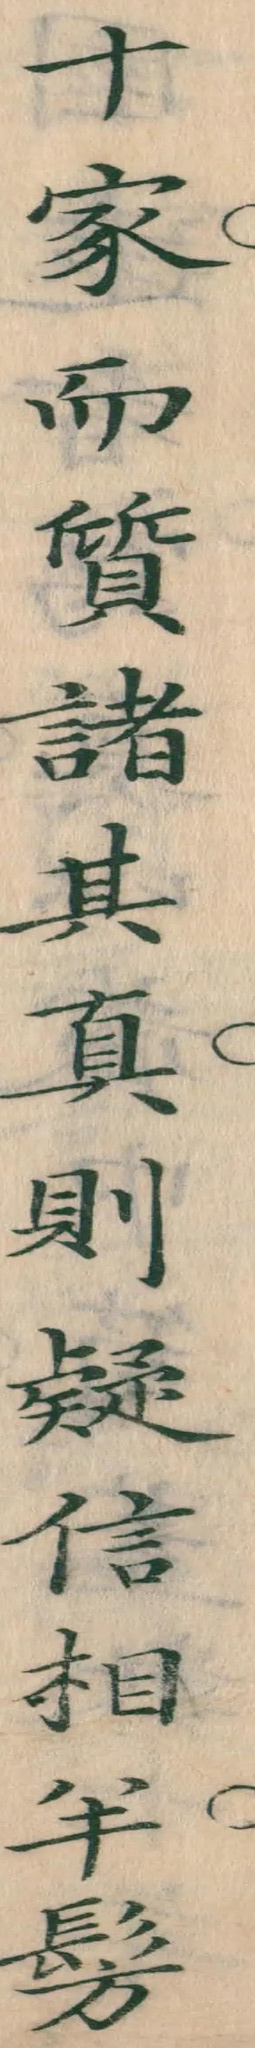十家。而質諸其真。則疑信相半。髣
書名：花彙 草部4巻木部4巻. [1]
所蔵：国立国会図書館 National Diet Library, JAPAN
